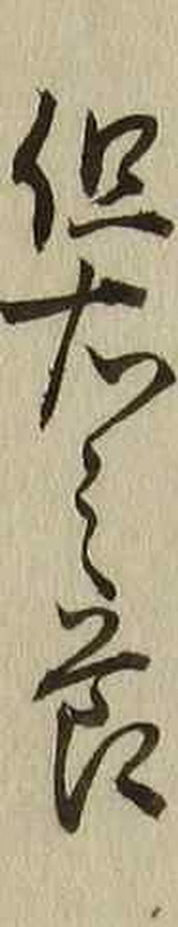但右之節
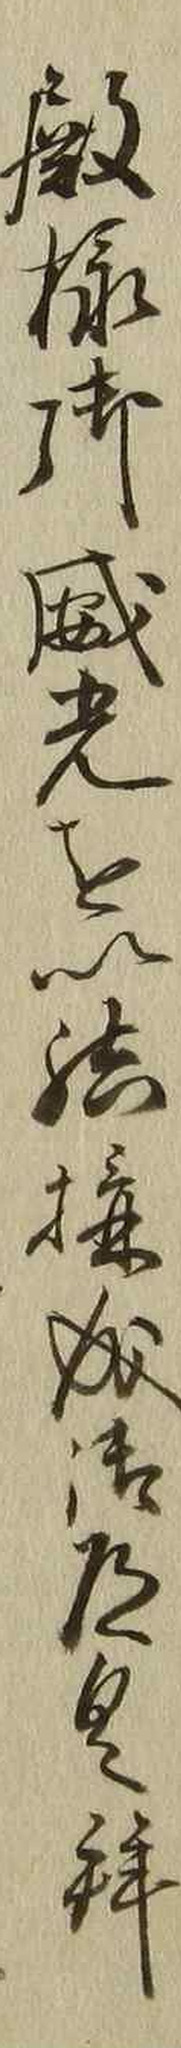殿様御威光を以結構成御道具拝
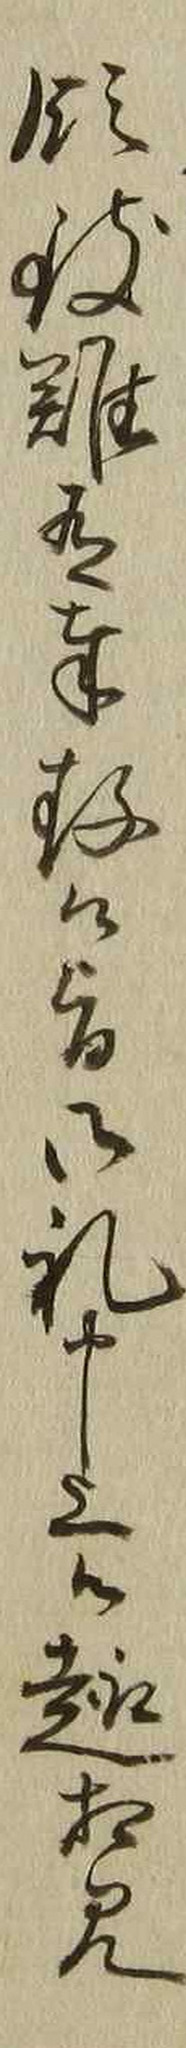領致難有奉存候旨御礼申上候趣相見
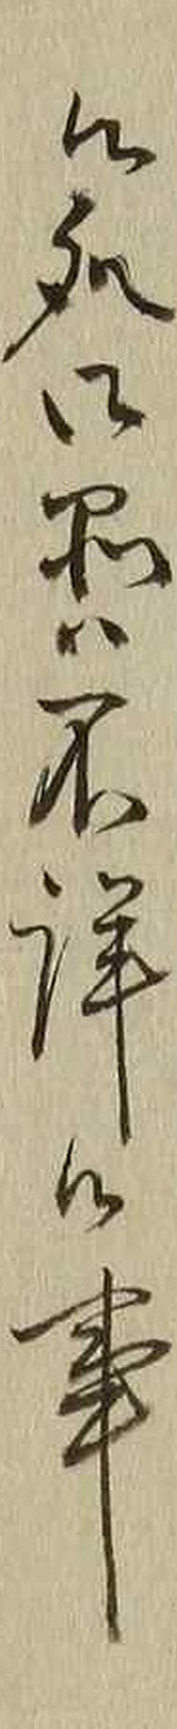候処御品ハ不詳候事
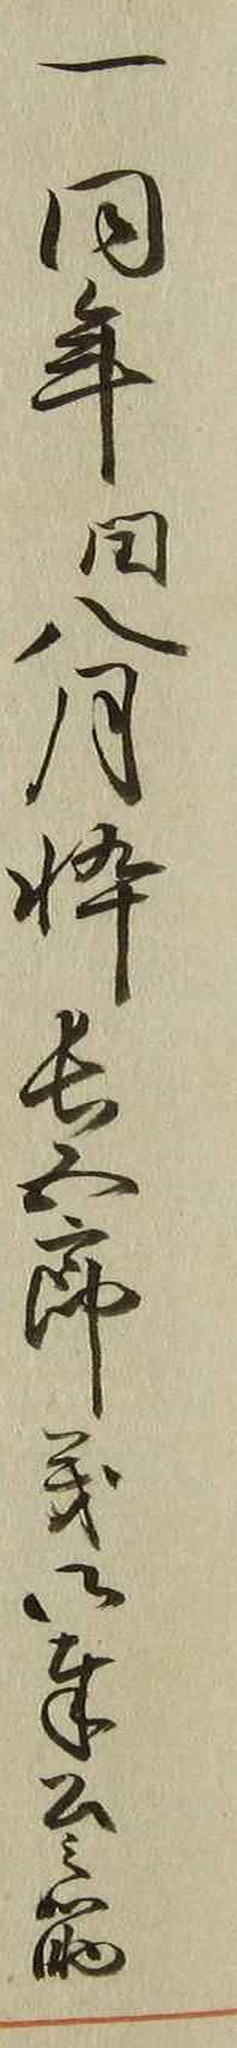一同年閏八月忰長五郎義御奉公之筋
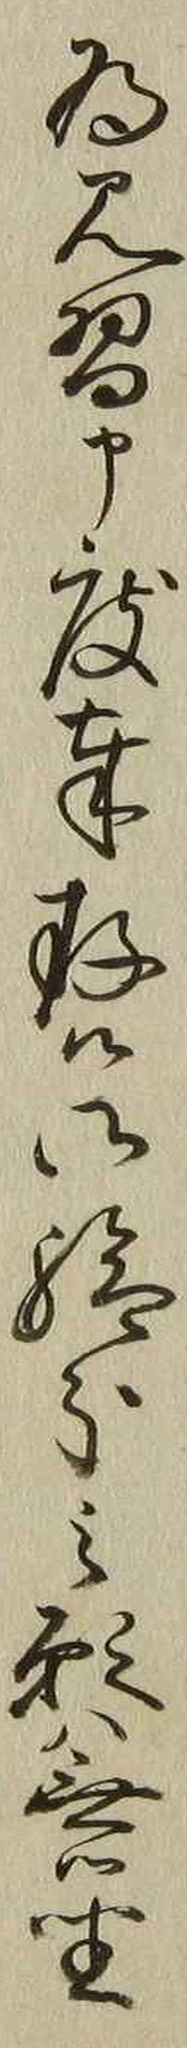為見習申度奉存候給分之願ハ無御坐
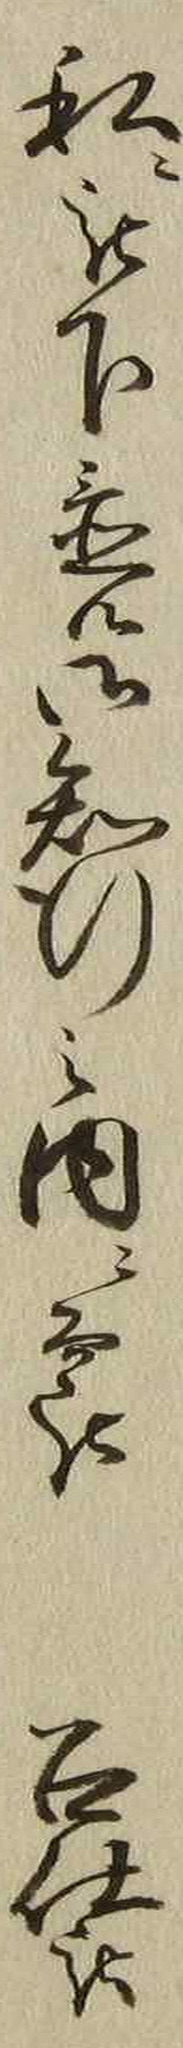私ニ被下置候御知行之内ニ而被召仕被
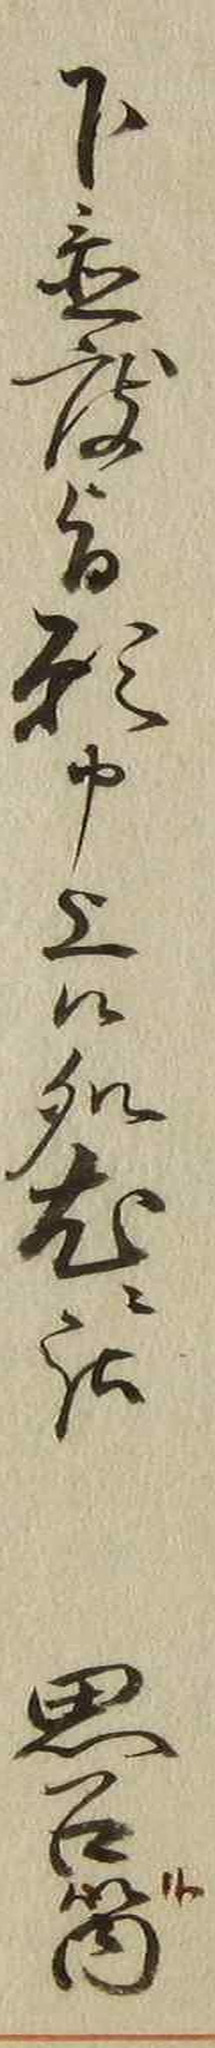下置度旨願申上候処尤ニ被思召候内
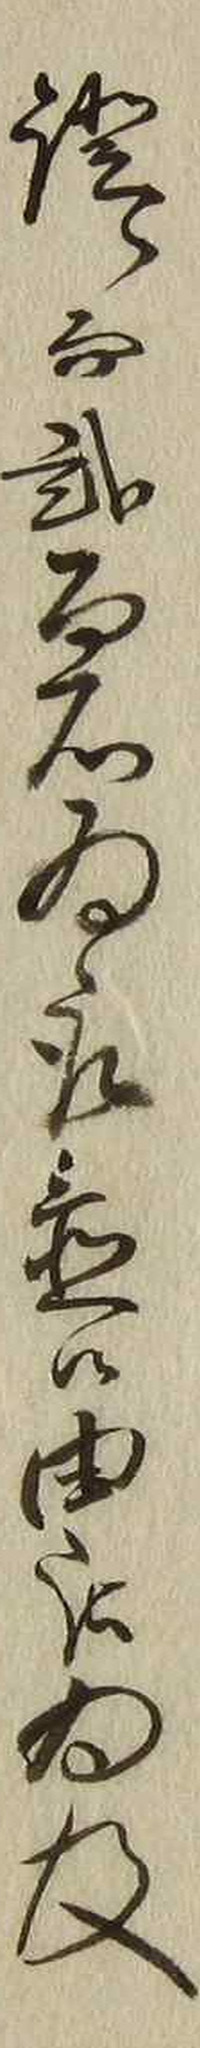証ニ而弐百石為取置候由被為及
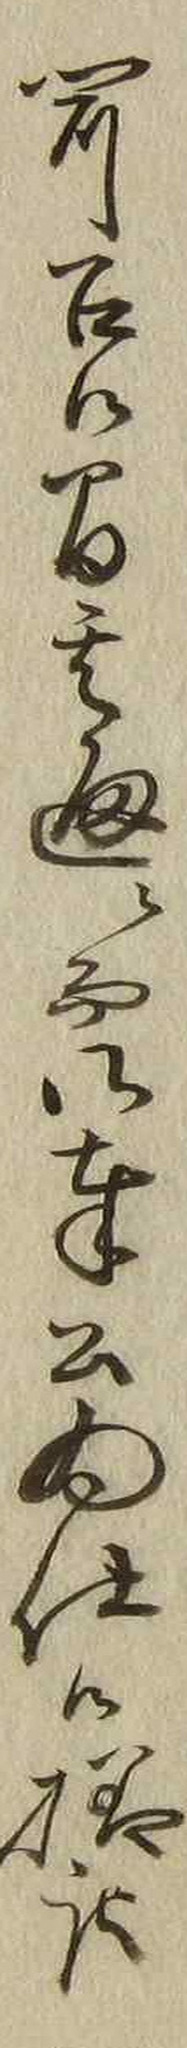聞召候間其通ニ而御奉公為仕候様被
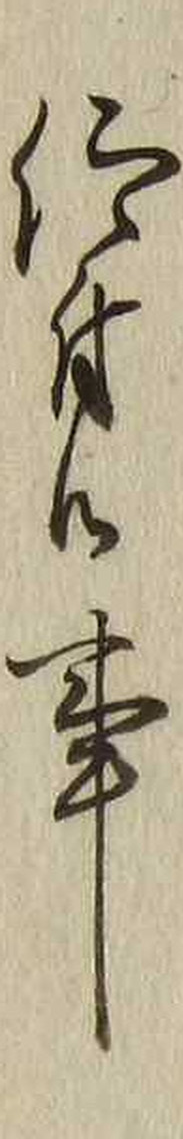仰付候事
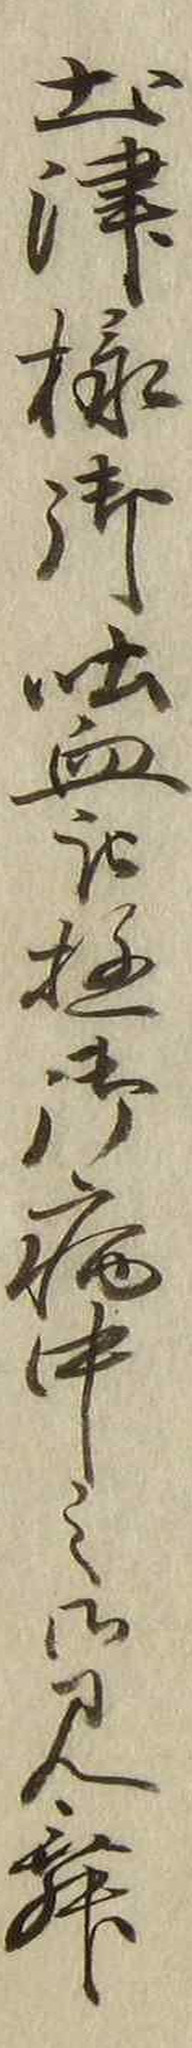土津様御吐血被遊御病中之御見舞
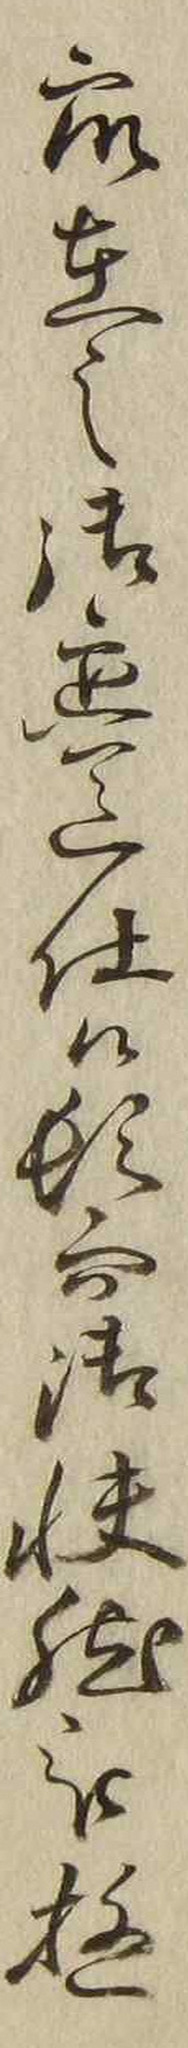衆在之御迎送仕候頓而御快然被遊

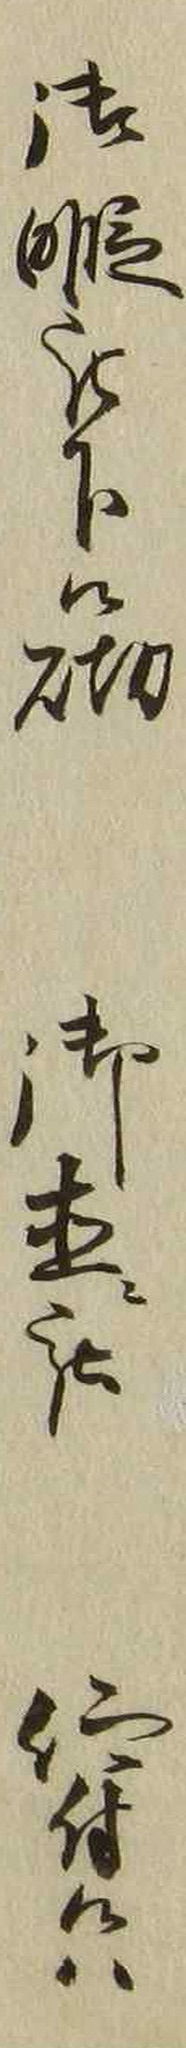御暇被下候砌御直ニ被仰付候ハ
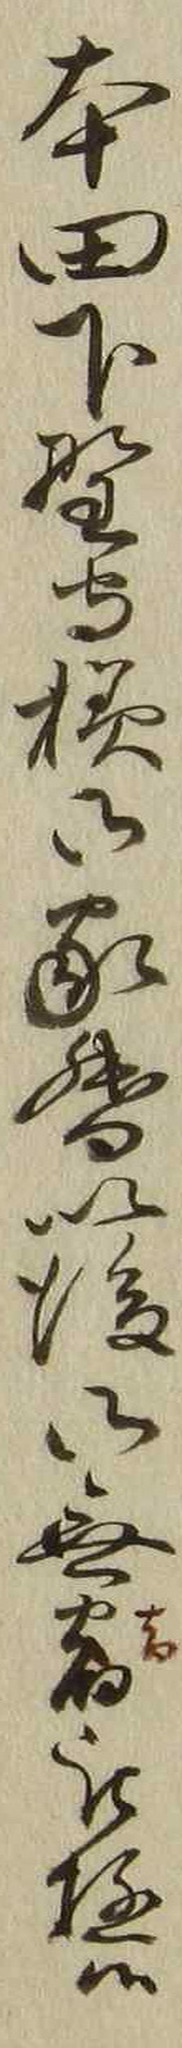本田下野守様御家替以後御無知被遊候
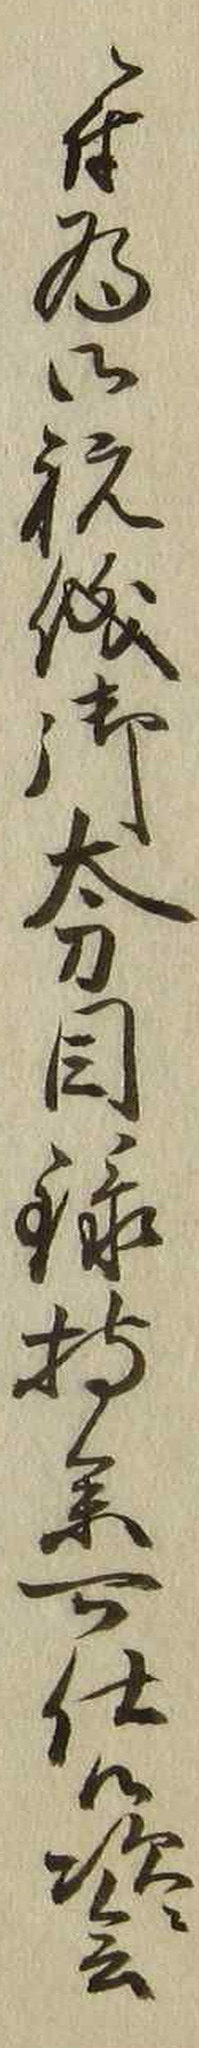ニ付為御祝儀御太刀目録持参可仕候次ニ会
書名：諸士系譜　巻之60　と之部3
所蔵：会津若松市立会津図書館
